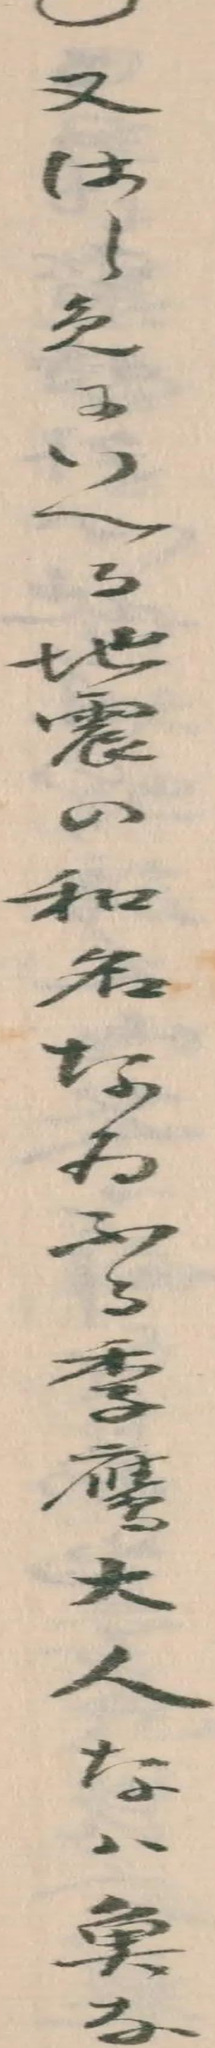○又はしめにいへる地震の和名なゐふる季鷹大人なは魚な
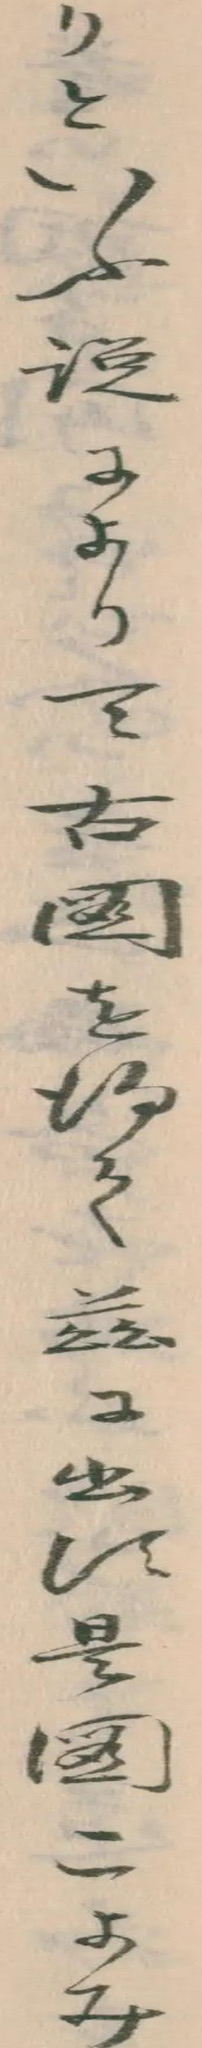りといふ説によりて古図を得て茲に出す是図こよみ
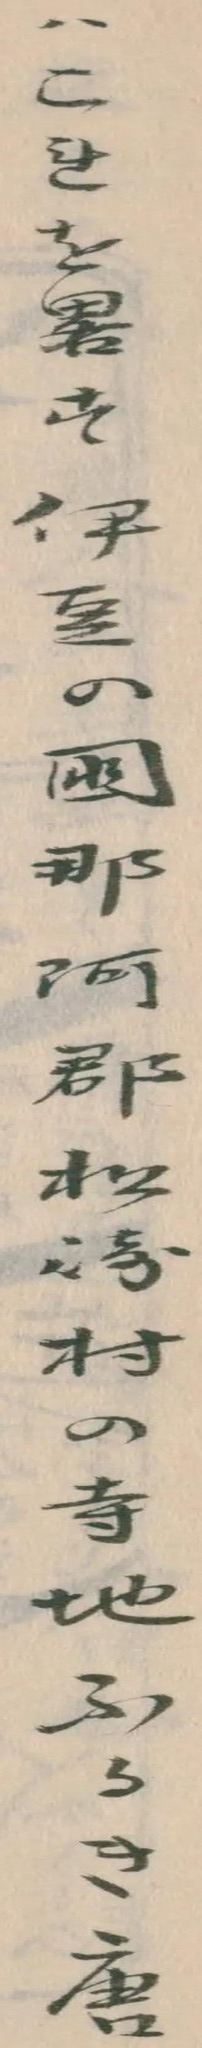はこれを略す伊豆の国那珂郡松崎村の寺地ふるき唐
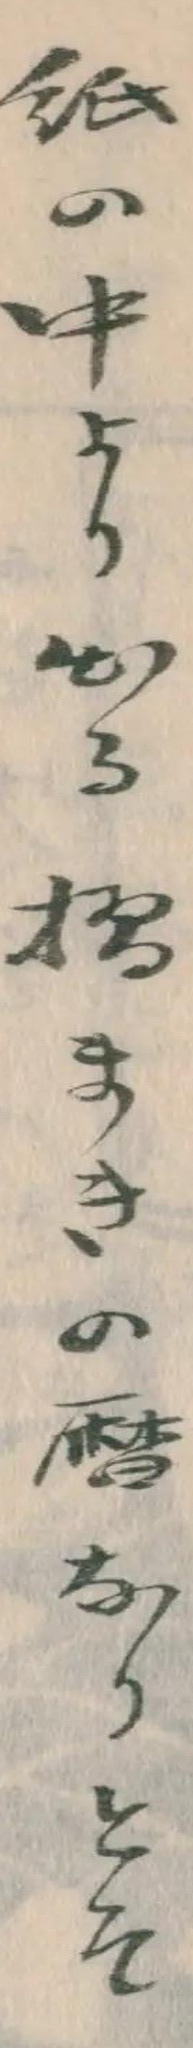紙の中より出る摺まきの暦なりとそ

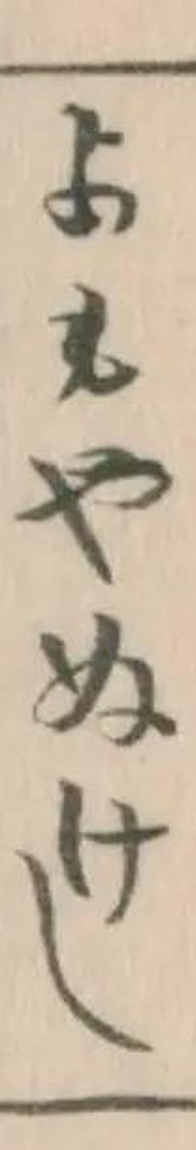よもやぬけし
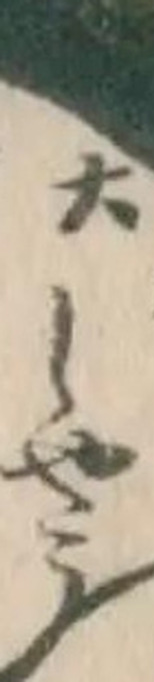大しやう
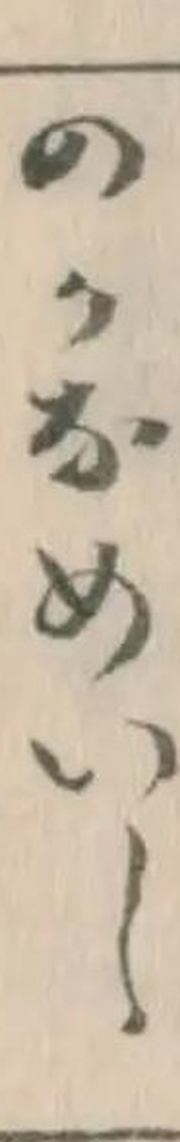のかなめいし
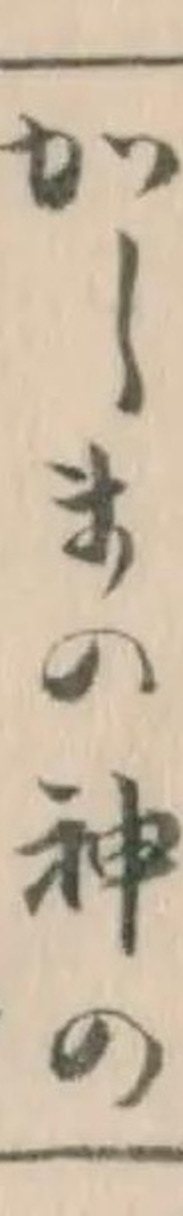かしまの神の
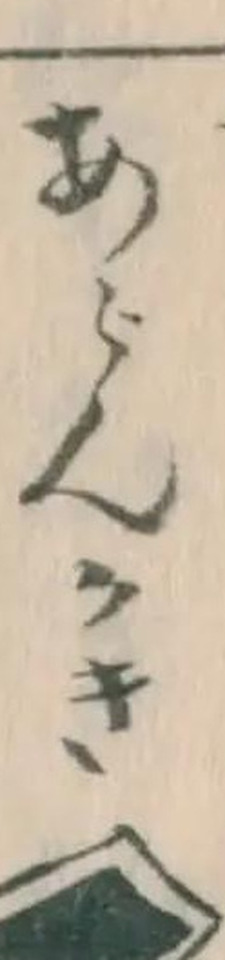あらんかき
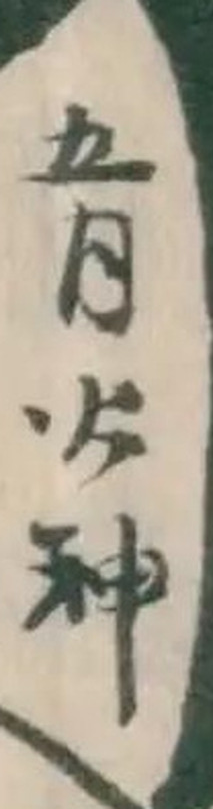「五月火神
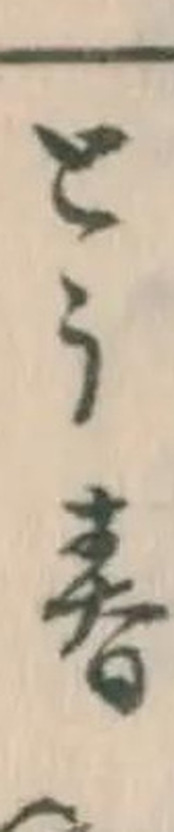とう春
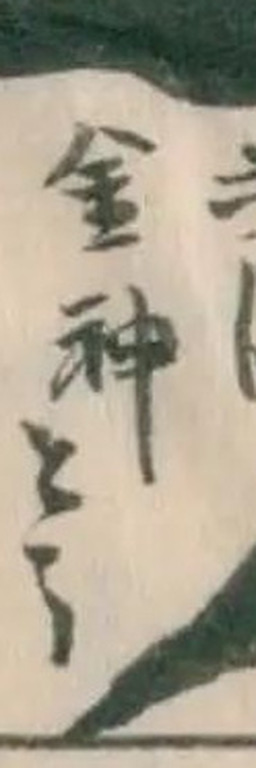金神とう
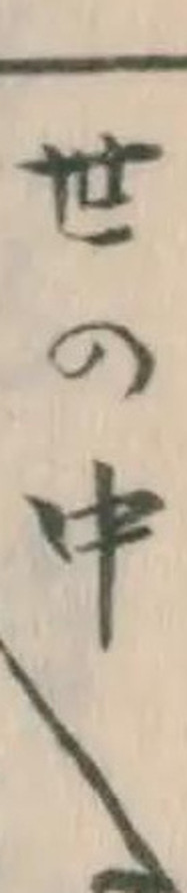世の中
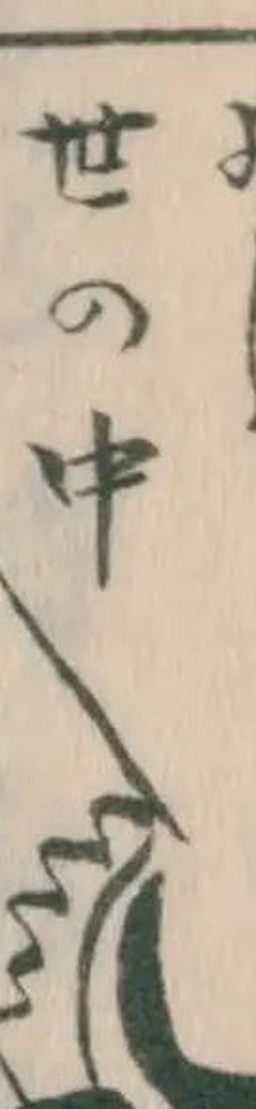世の中
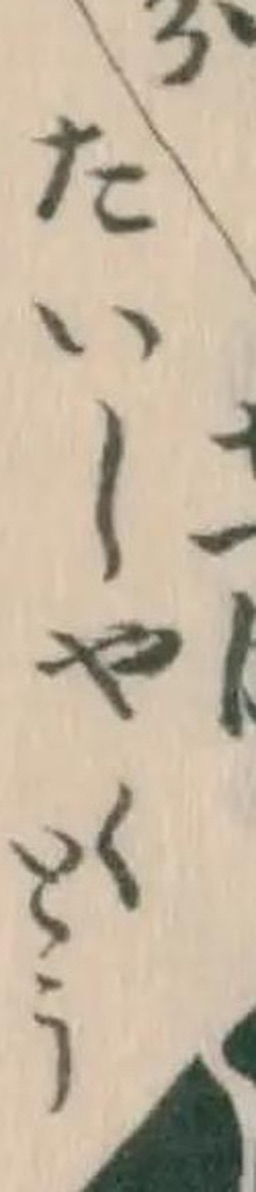たいしやくとう
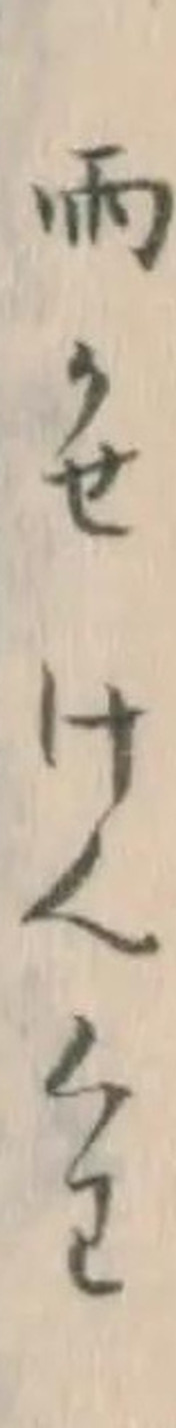雨かせけんくわ」
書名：地災撮要. 巻11-12(地震之部)
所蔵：国立国会図書館 National Diet Library, JAPAN
